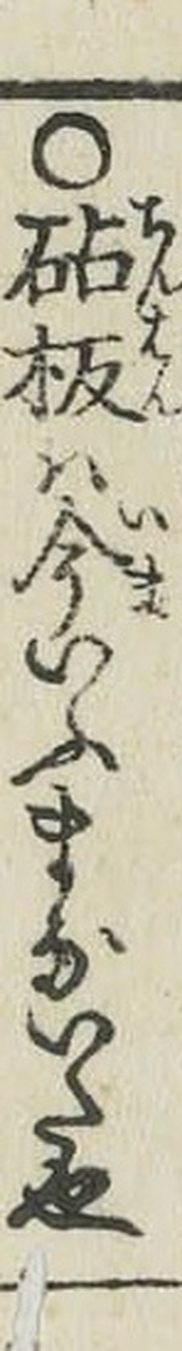○砧板は今いふまないた也
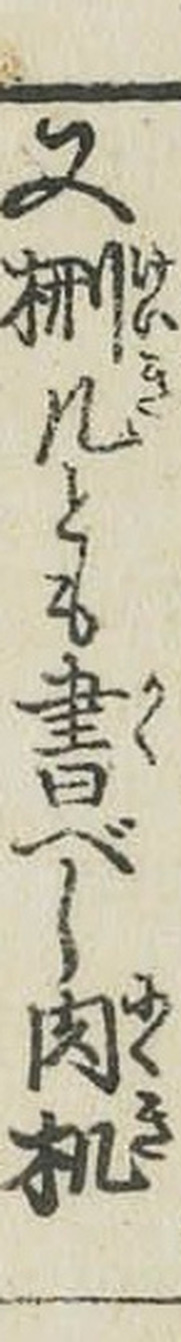又▢几とも書べし肉机
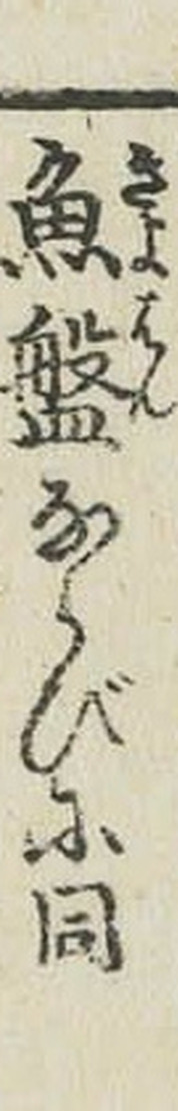魚盤ならびに同
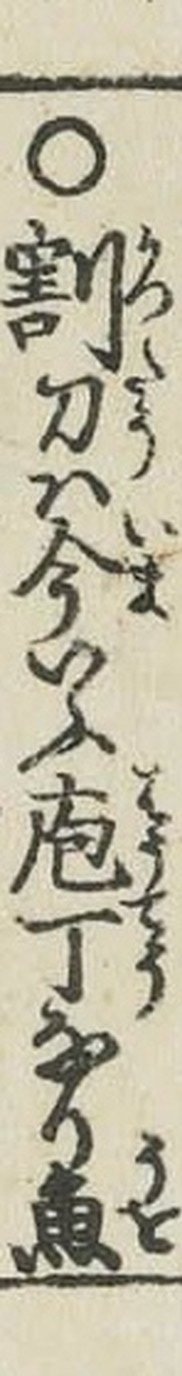○割刀は今いふ庖丁なり魚
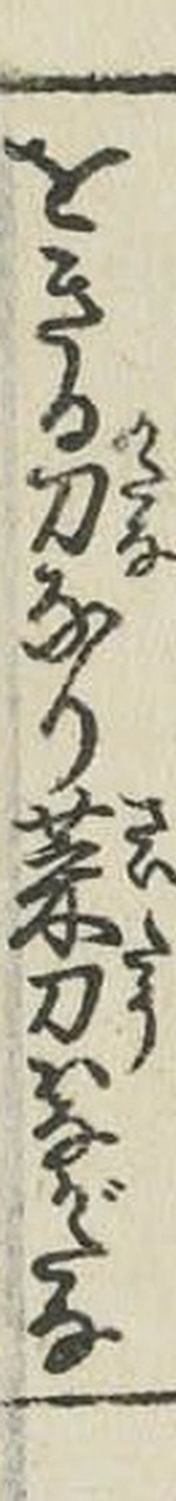をきる刀なり菜刀はながたな
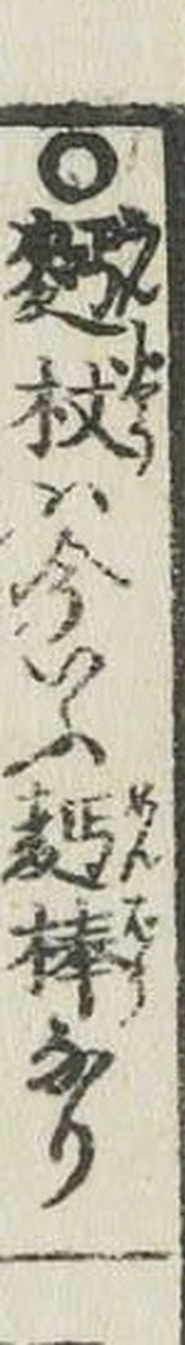○麺杖は今いふ麺棒なり
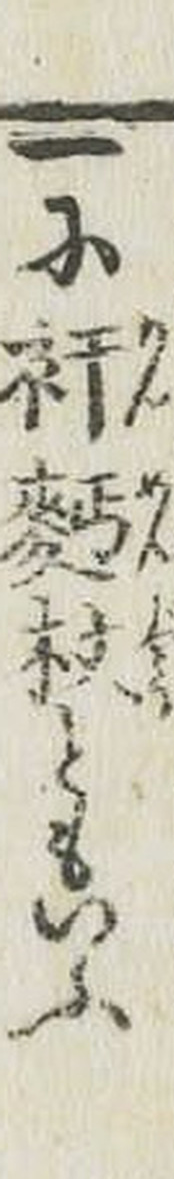一に衦麺杖ともいふ
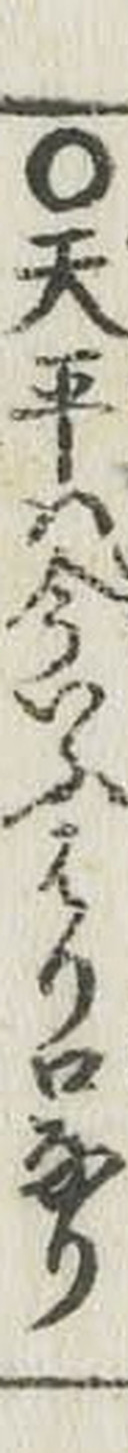○天平は今いふはり口なり
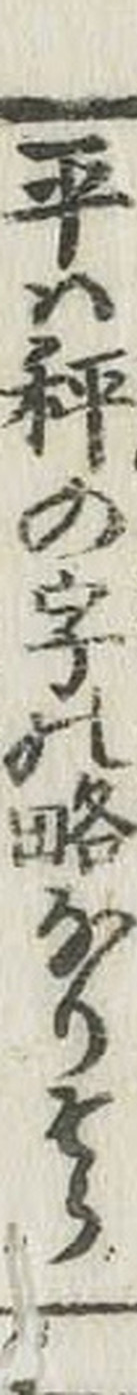平は秤の字の略なりそら
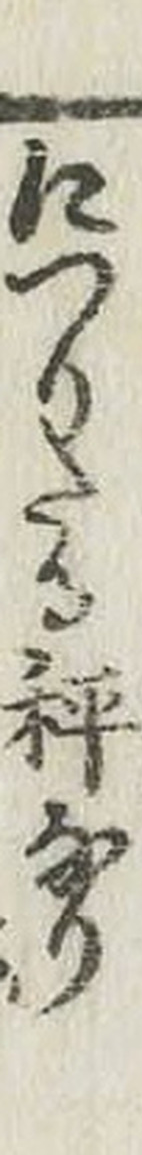につりたる秤なり
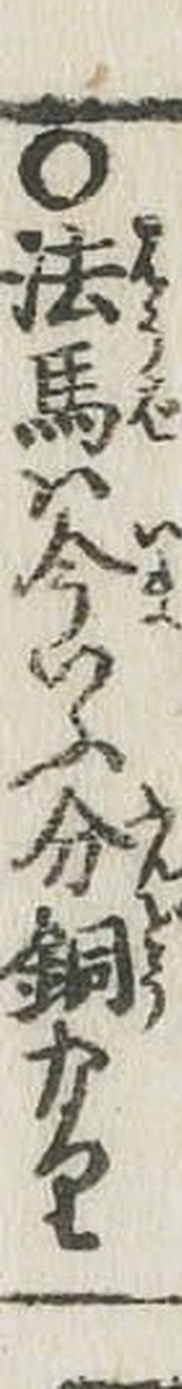○法馬は今いふ分銅なり
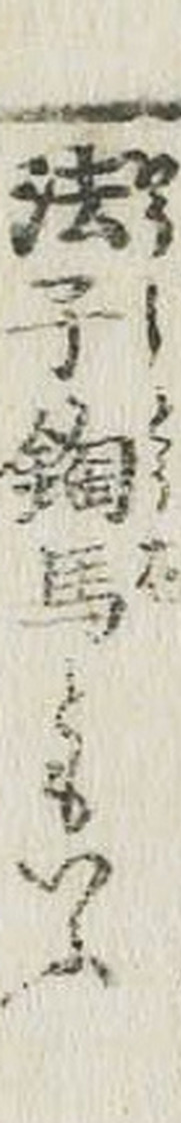法子鋾馬ともいふ
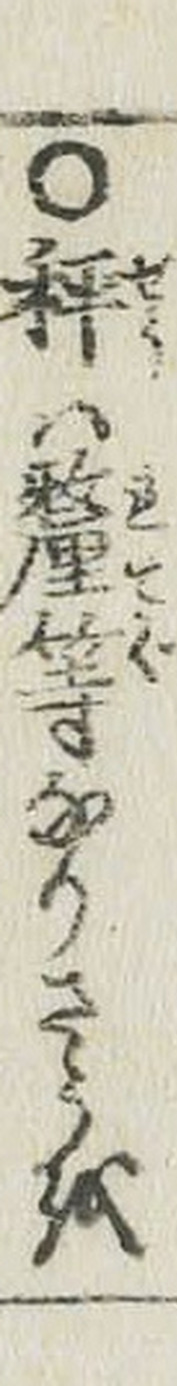○秤は𨤲等なりさうを
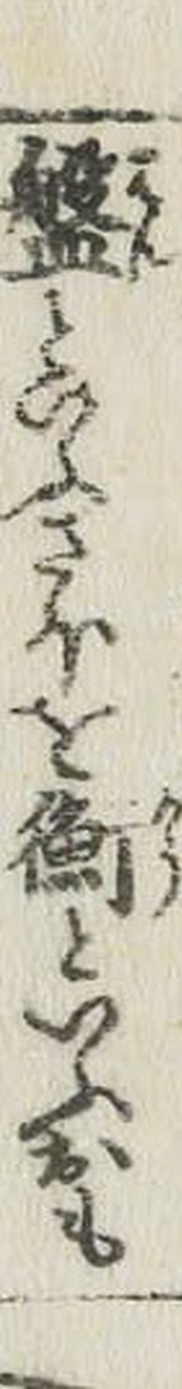盤といふさほを衡といふおも
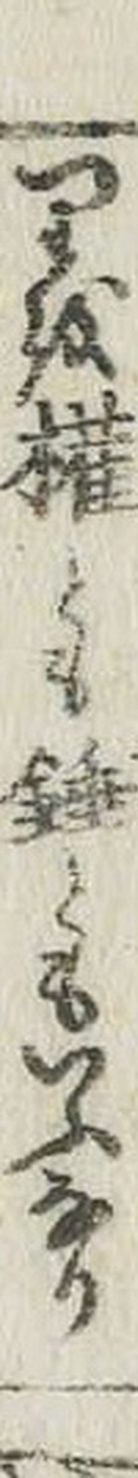りを権とも錘ともいふなり
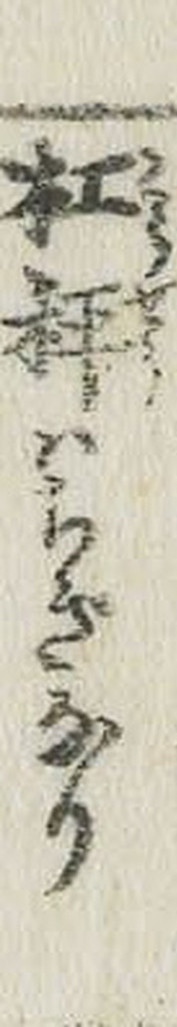杠秤はちぎなり
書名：増補頭書訓蒙図彙大成 10巻 5:巻之9-11
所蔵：東京学芸大学教育コンテンツアーカイブ
